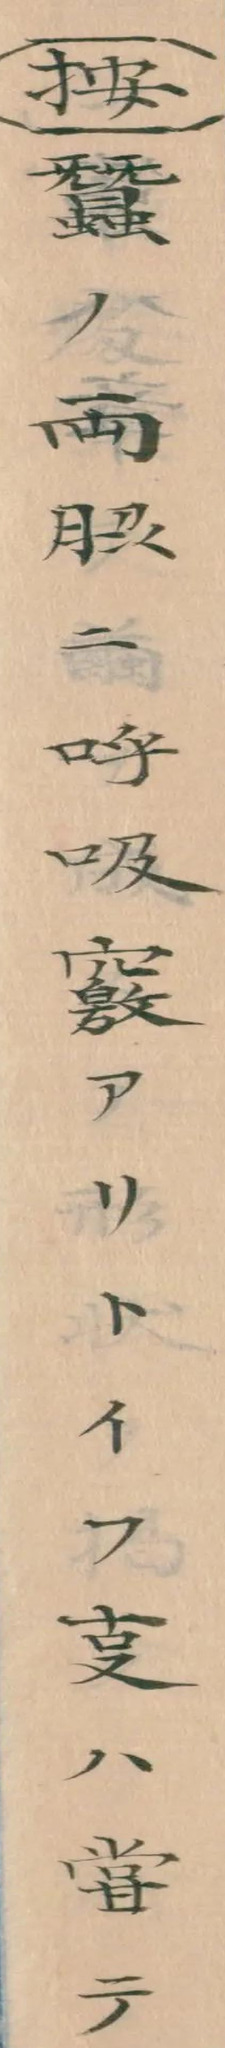[按]蚕ノ両脇ニ呼吸竅アリトイフ事ハ嘗テ
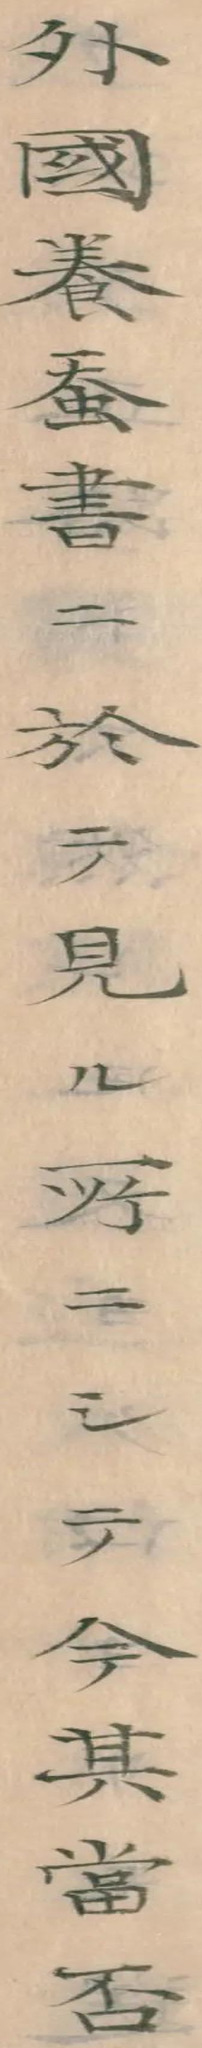外国養蚕書ニ於テ見ル所ニシテ今其当否
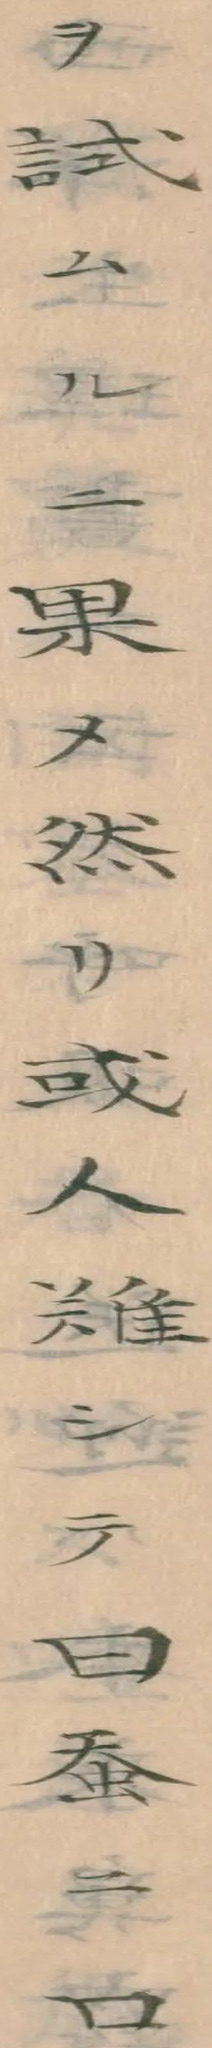ヲ試ムルニ果シテ然リ或人難シテ曰蚕ニ口
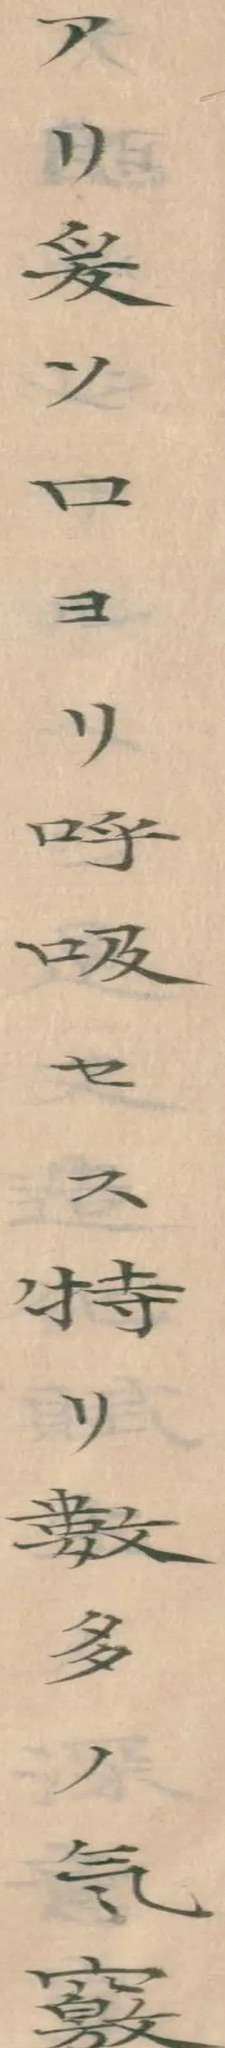アリ爰ソ口ヨリ呼吸セス特リ数多ノ気竅
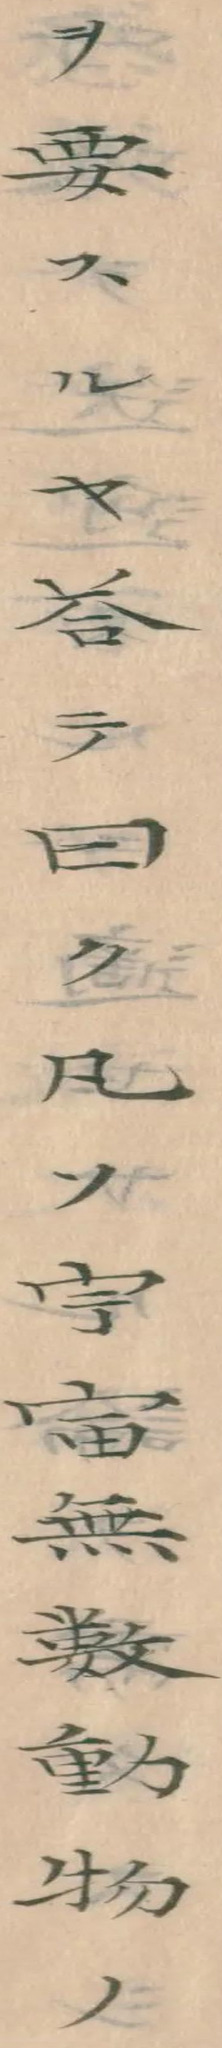ヲ要スルヤ答テ曰ク凡ソ宇宙無数動物ノ
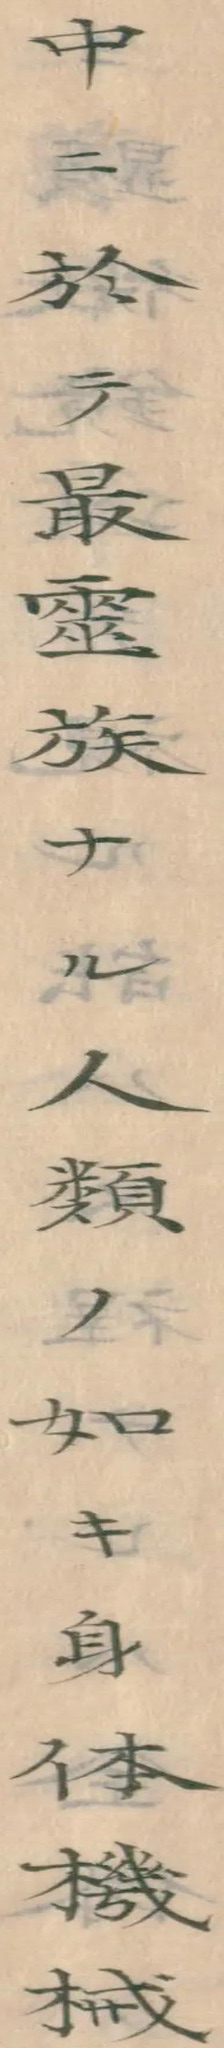中ニ於テ最霊族ナル人類ノ如キ身体機械
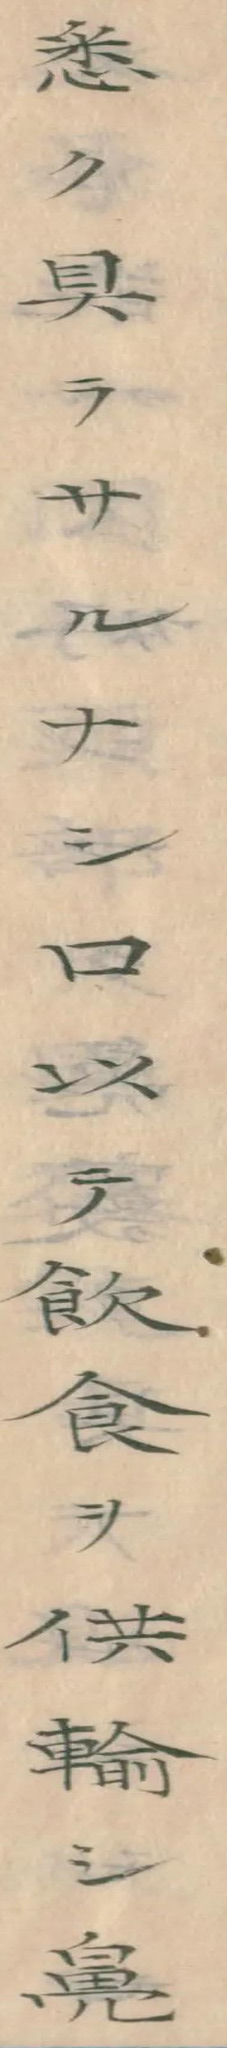悉ク具ラサルナシ口以テ飲食ヲ供輸シ鼻
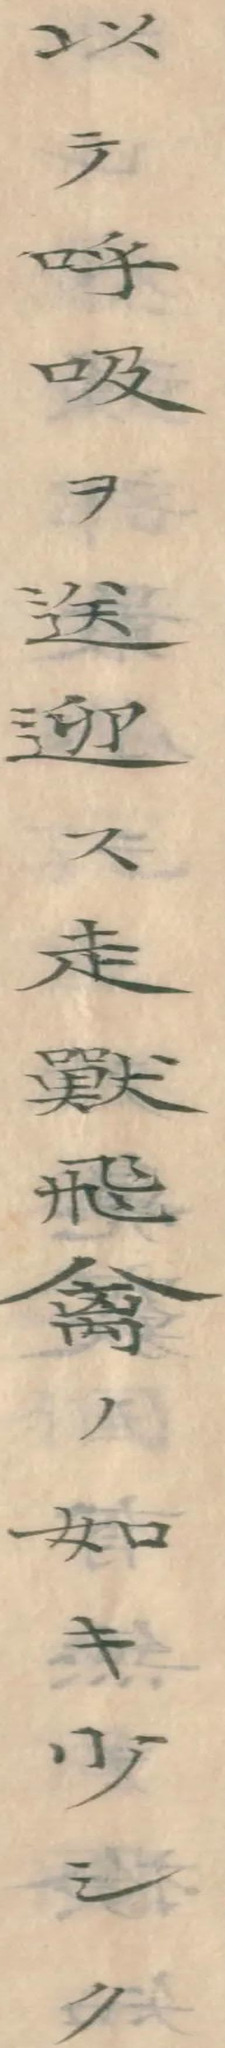以テ呼吸ヲ送迎ス走獣飛禽ノ如キ少シク
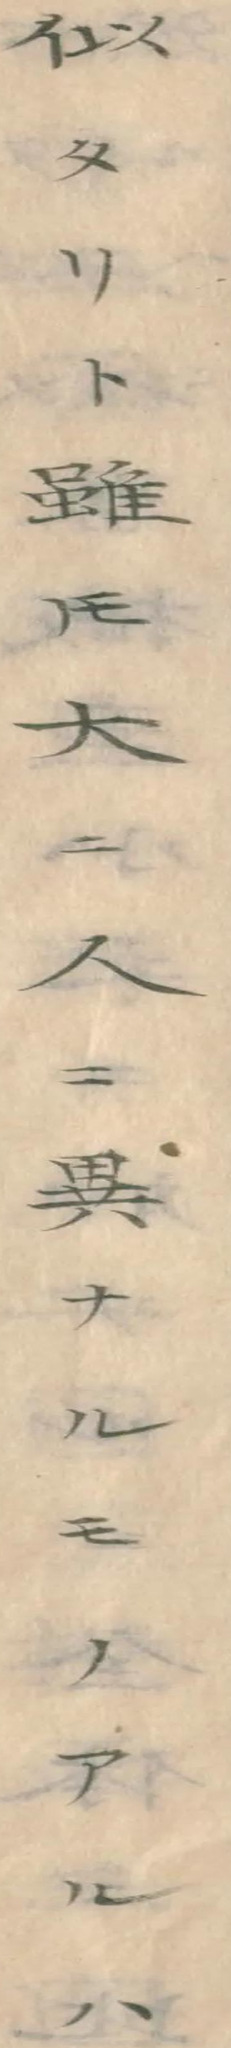似タリト雖トモ大ニ人ニ異ナルモノアルハ
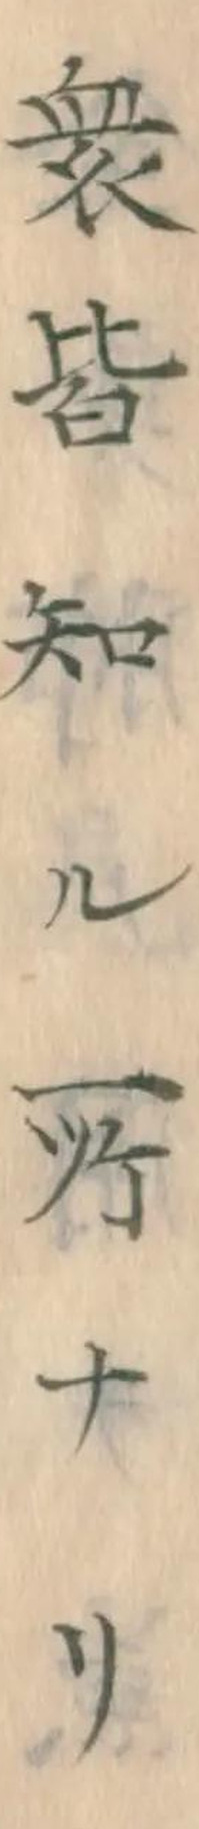衆皆知ル所ナリ
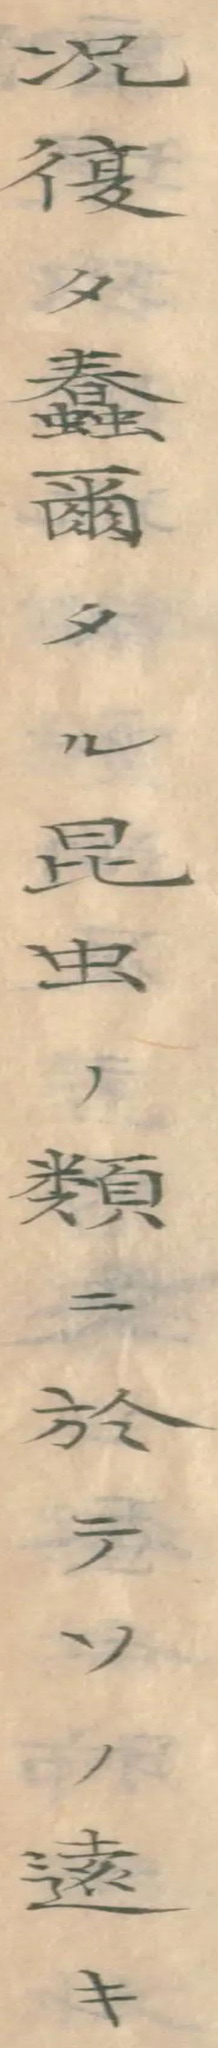況復タ蠢爾タル昆虫ノ類ニ於テソノ遠キ

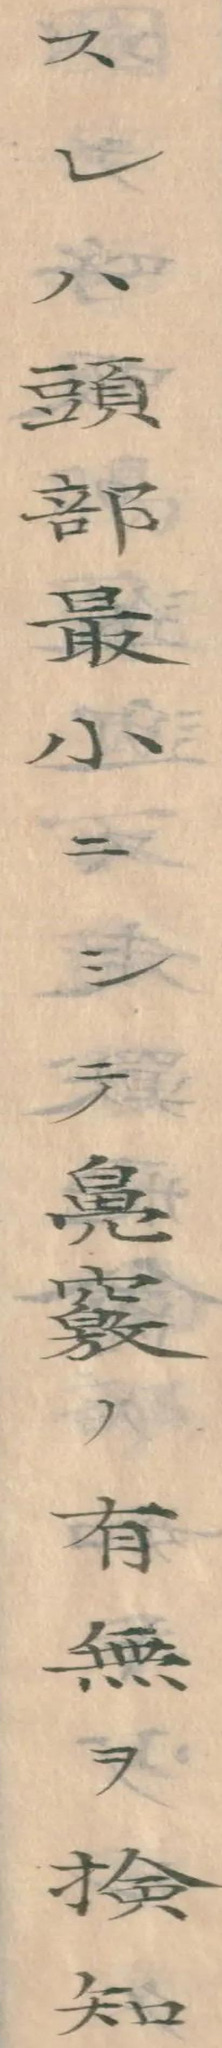スレハ頭部最小ニシテ鼻竅ノ有無ヲ検知
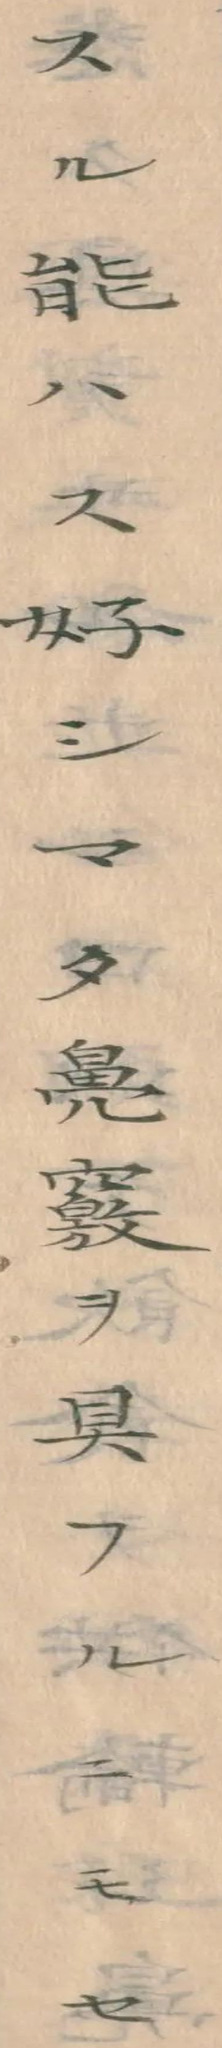スル能ハス好シマタ鼻竅ヲ具フルニモセ
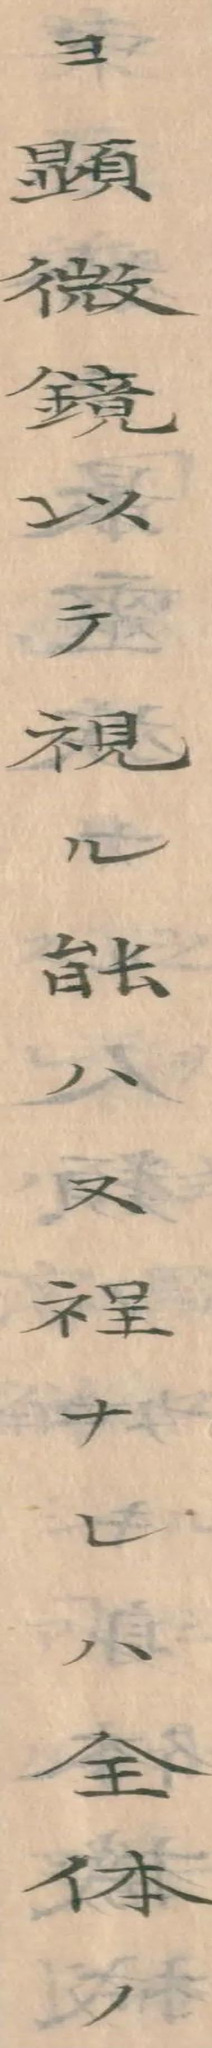ヨ顕微鏡以テ視ル能ハヌ程ナレハ全体ノ
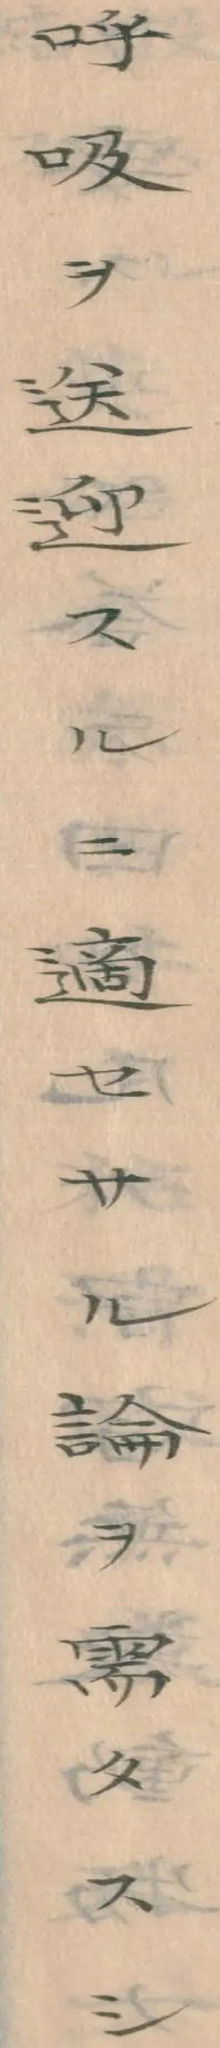呼吸ヲ送迎スルニ適セサル論ヲ需タスシ
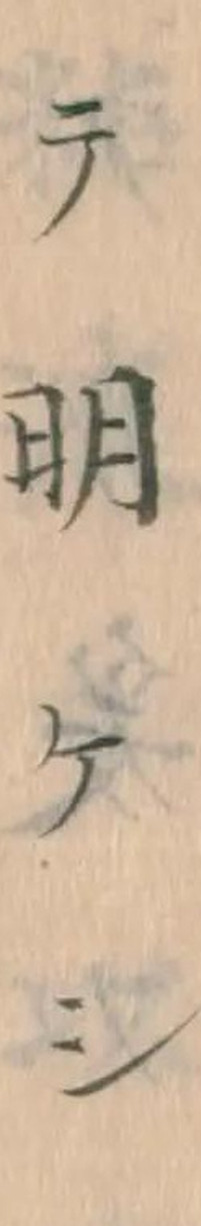テ明ケシ
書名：蚕桑集成
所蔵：国立国会図書館 National Diet Library, JAPAN
